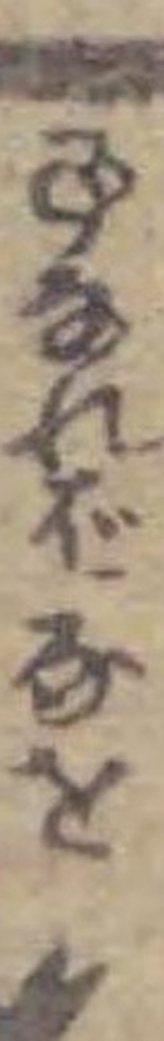事なればなを
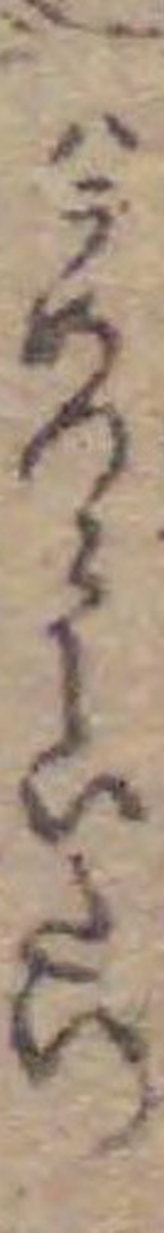ハテめつらしいたい
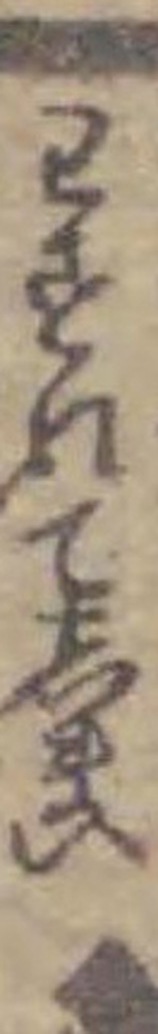わすれてしまい
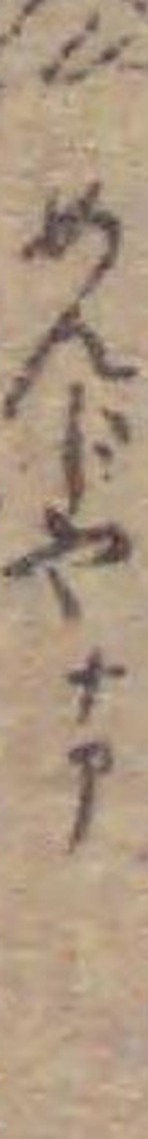めんじや
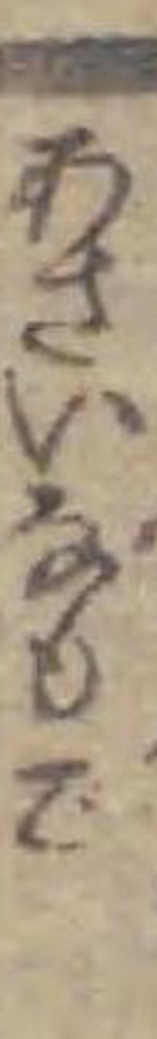あさいなもご
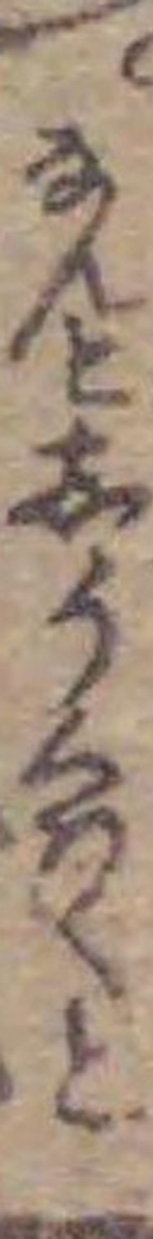なんとしうくは〳〵と
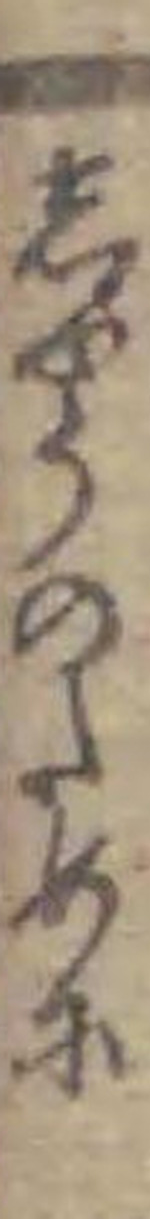しやうのために
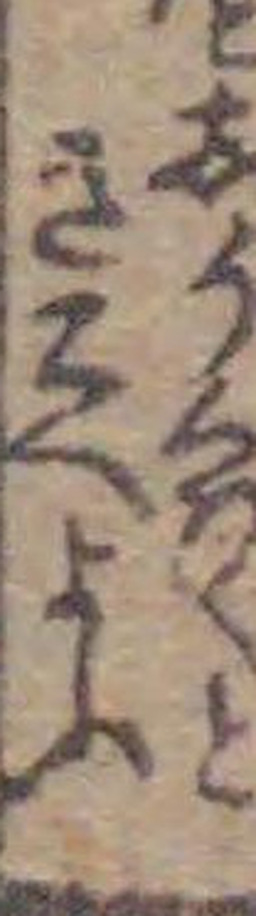きこへよふ
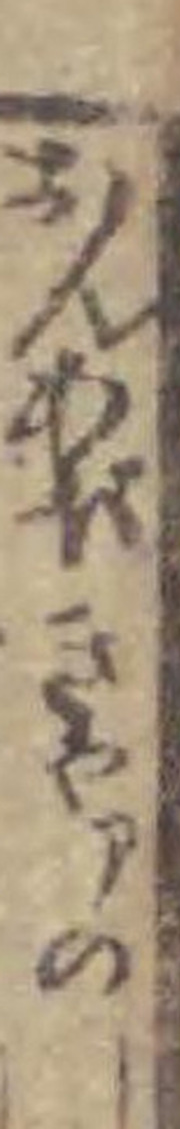おんあぼきやの
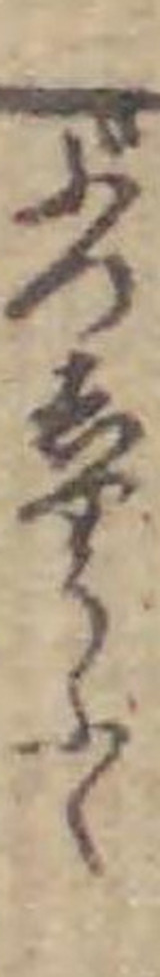ぶつしやうふく
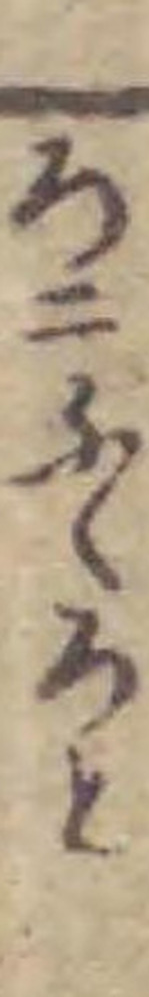ろにふくろと
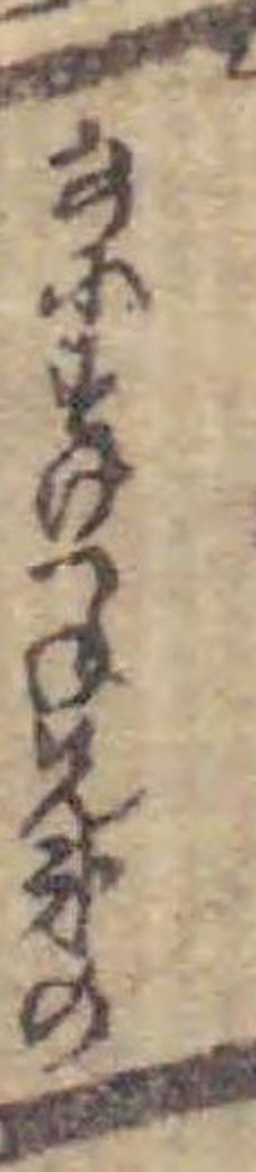なにすけつね兄弟の
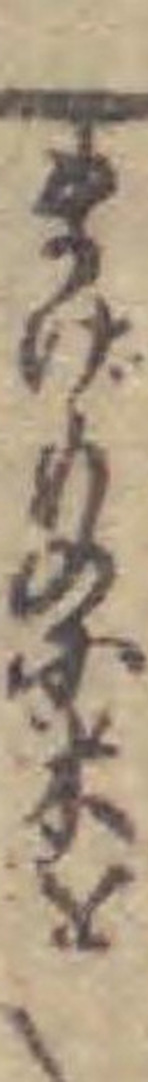まげものに米を
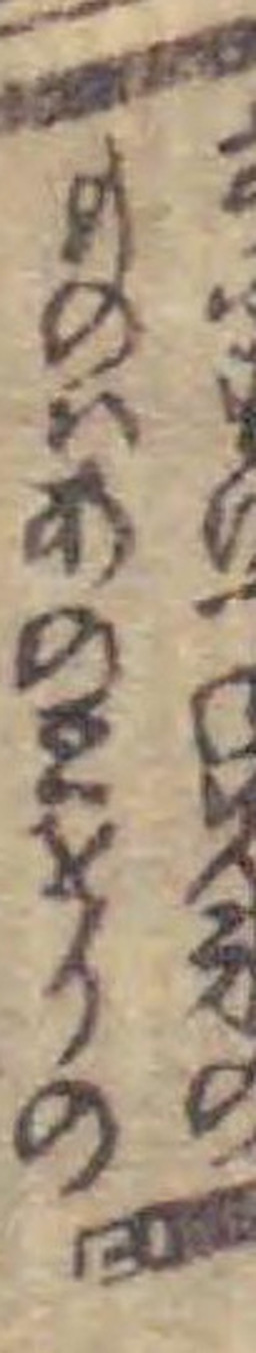ものはあのとをりの
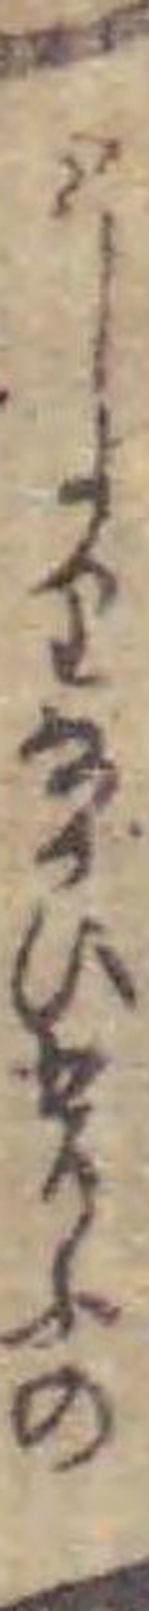としよりながひせりふの
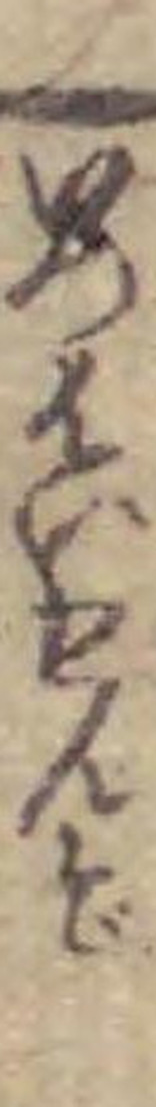いつはいせんぞ
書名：年寄之冷水曽我 : 3巻
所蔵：国立国会図書館 National Diet Library, JAPAN
